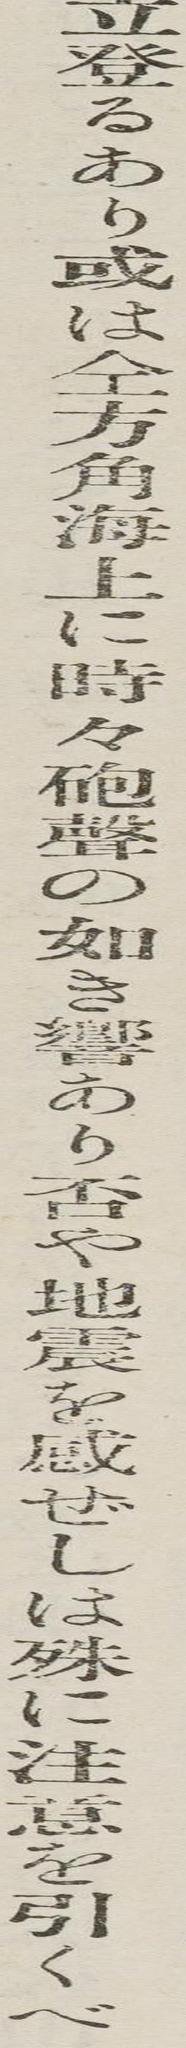立登るあり或は全方角海上に時々砲声の如き響あり否や地震を感ぜしは殊に注意を引くべ
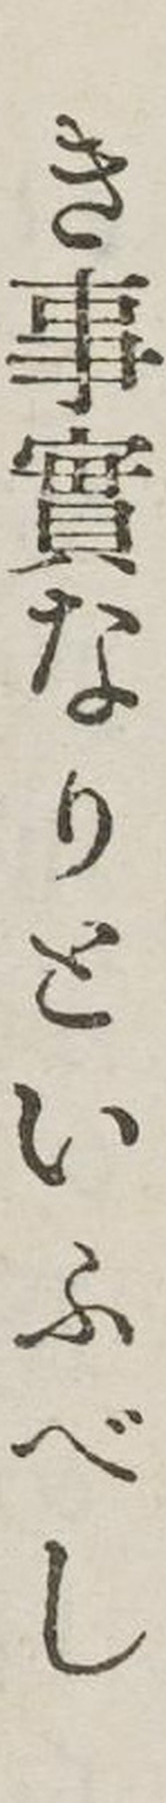き事実なりといふべし
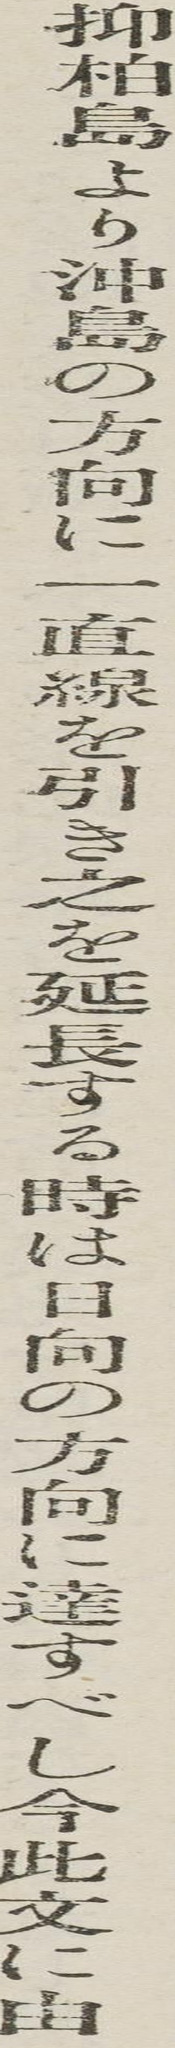抑柏島より沖島の方向に一直線を引き之を延長する時は日向の方向に達すべし今此文に由

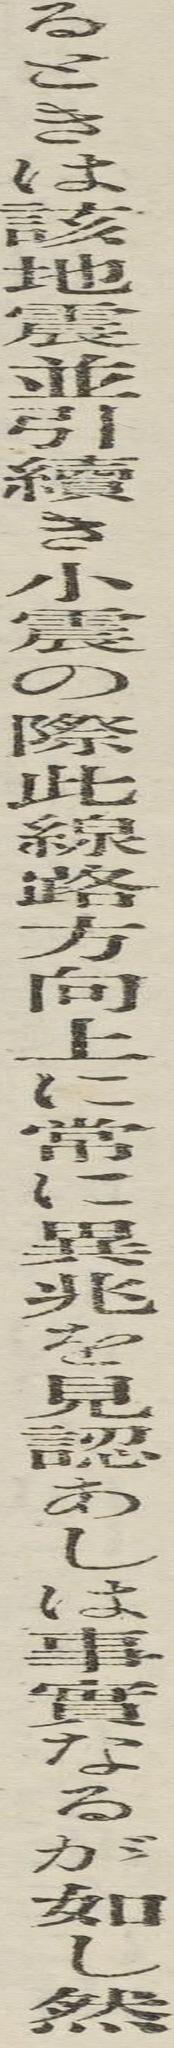るときは該地震並引続き小震の際此線路方向上に常に異兆を見認あしは事実なるが如し然
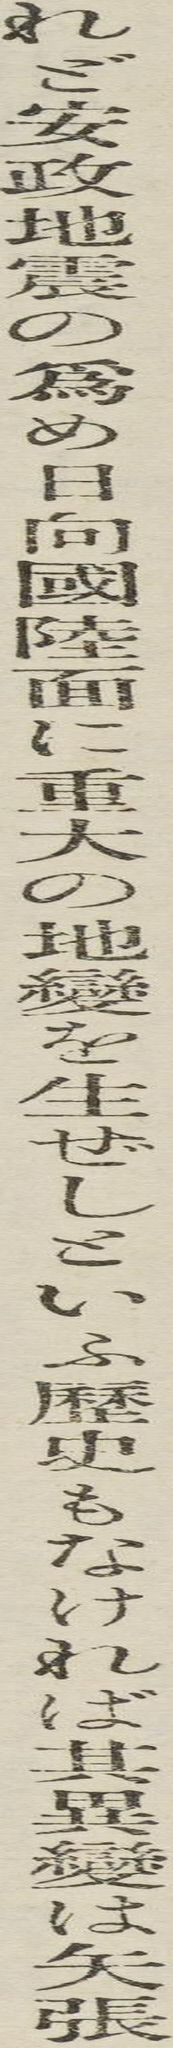れど安政地震の為め日向国陸面に重大の地変を生ぜしといふ歴史もなければ其異変は矢張
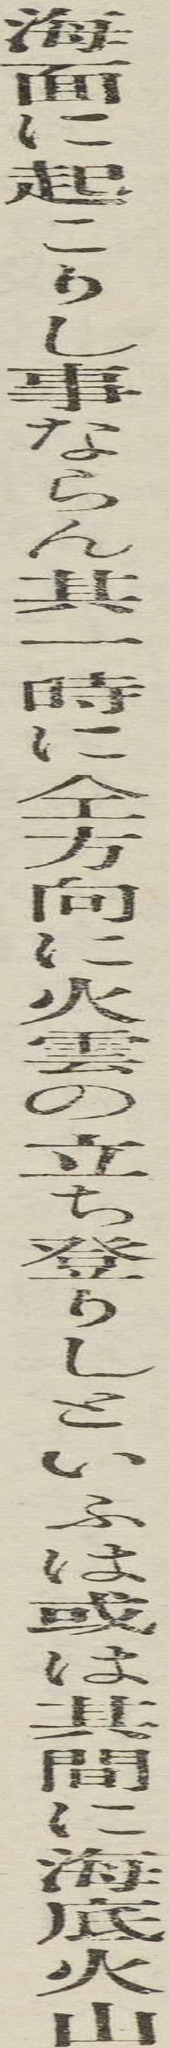海面に起こりし事ならん其一時に同方向に火雲の立ち登りしといふは或は其間に海底火山
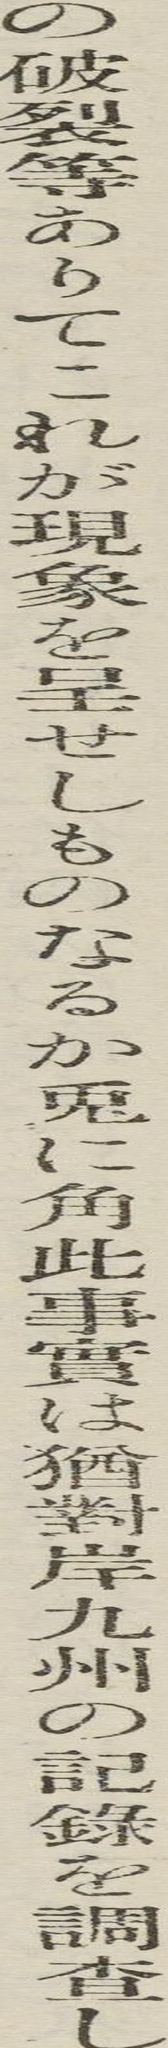の破裂等ありてこれが現象を呈せしものなるか兎に角此事実は猶対岸九州の記録を調査し
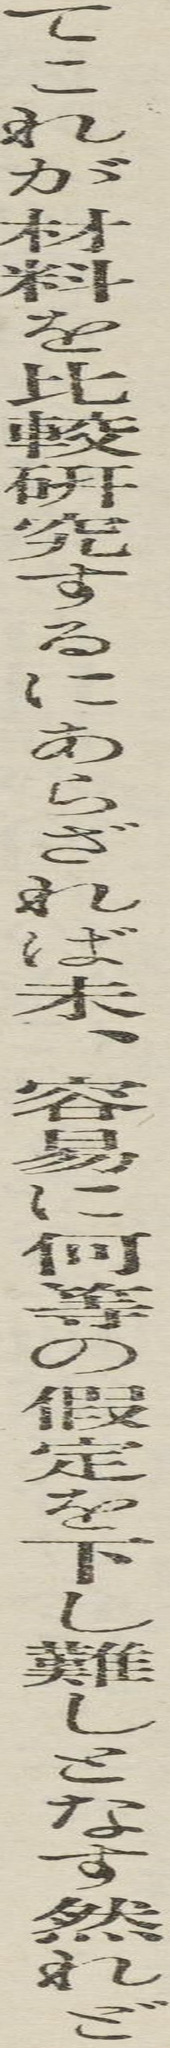てこれが材料を比較研究するにあらざれば未、容易に何等の仮定を下し難しとなす然れど
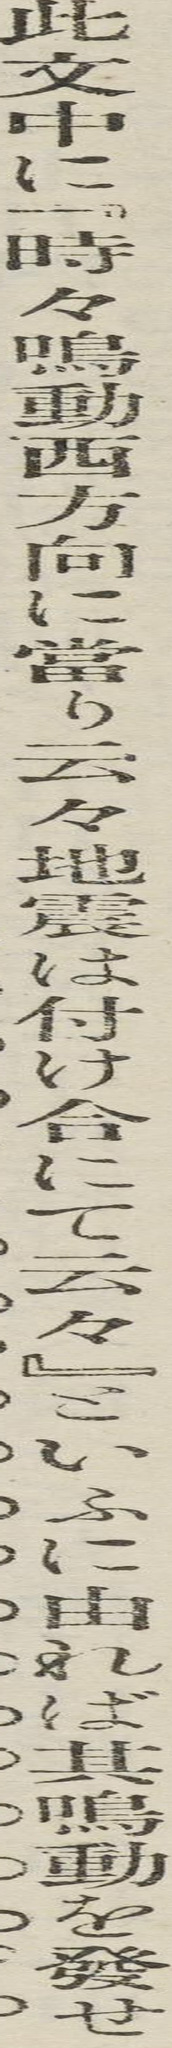此文中に一時々鳴動西方向に当り云々地震は付け合にて云々』といふに由れば其鳴動を発せ
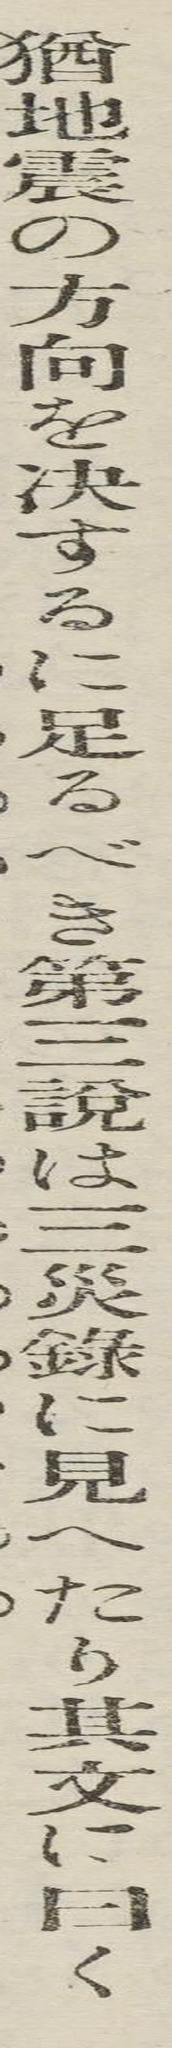猶地震の方向を決するに足るべき第三説は三災録に見へたり其文曰く
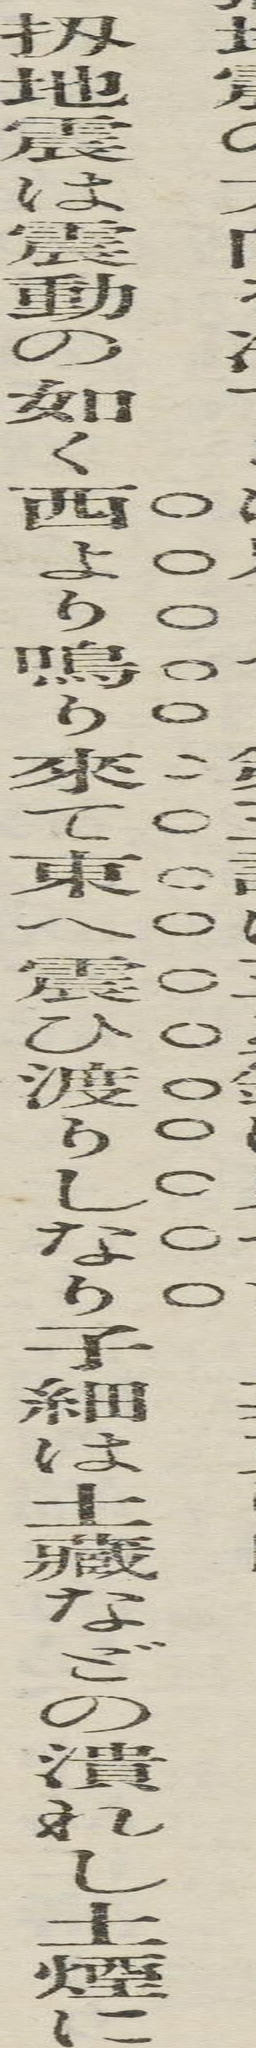扨地震は震動の如く西より鳴り来て東へ震ひ渡りしなり子細は土蔵などの潰れし土煙に
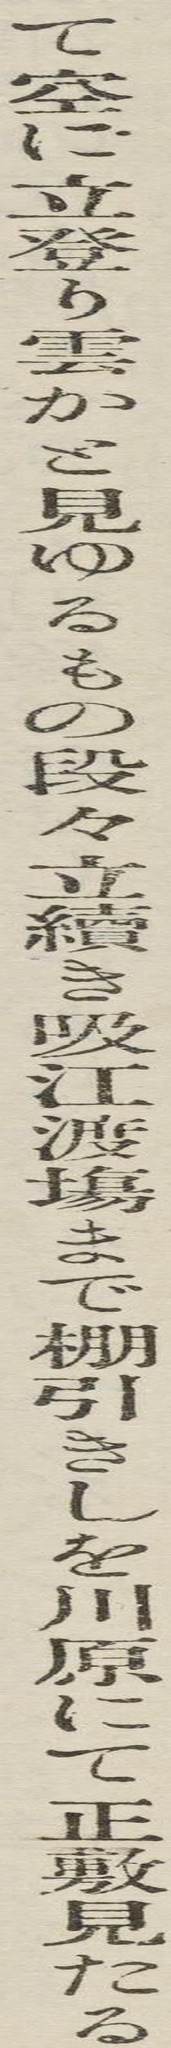て空に立登り雲かと見ゆるもの段々立続き吸江渡場まで棚引きしを川原にて正敷身たる
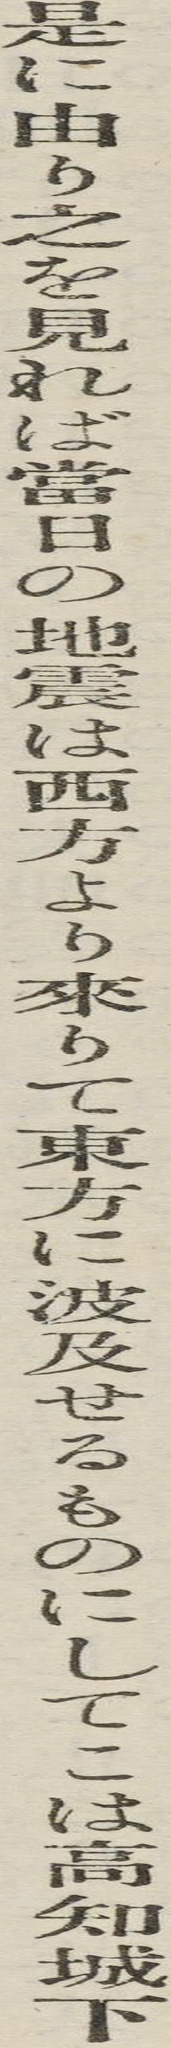是に由り之を見れば当日の地震は西方より来りて東方に波及せるものにしてこは高知城下
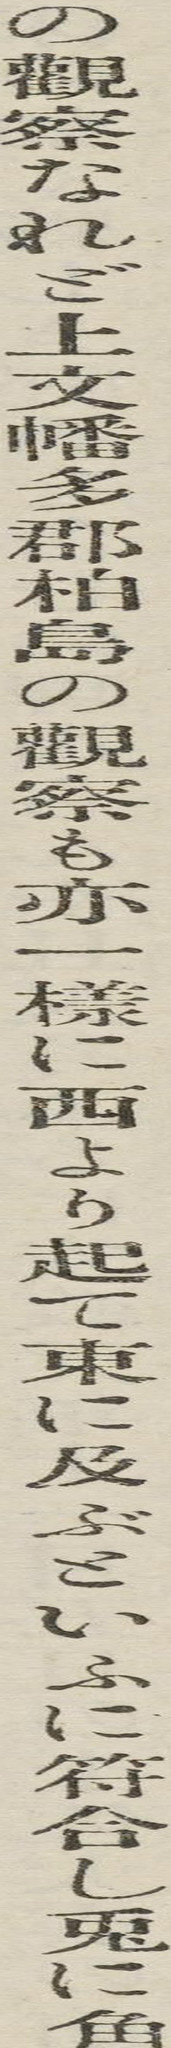の観察なれど上文幡多郡柏島の観察も亦一様に西より起て東に及ぶといふに符合し兎に角
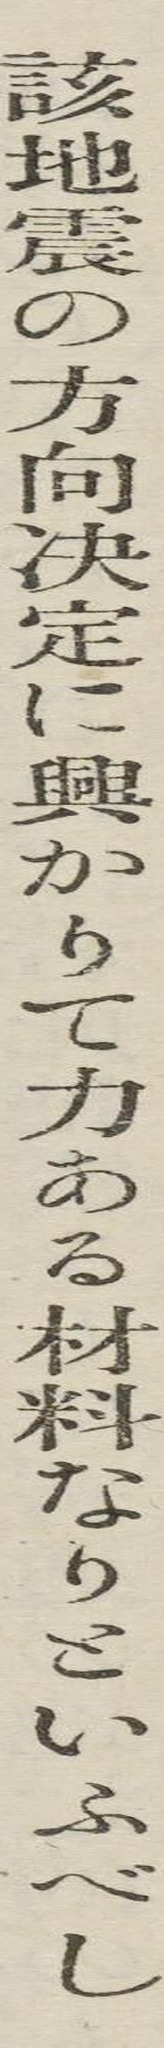該地震の方向決定に興かりて力ある材料なりといふべし
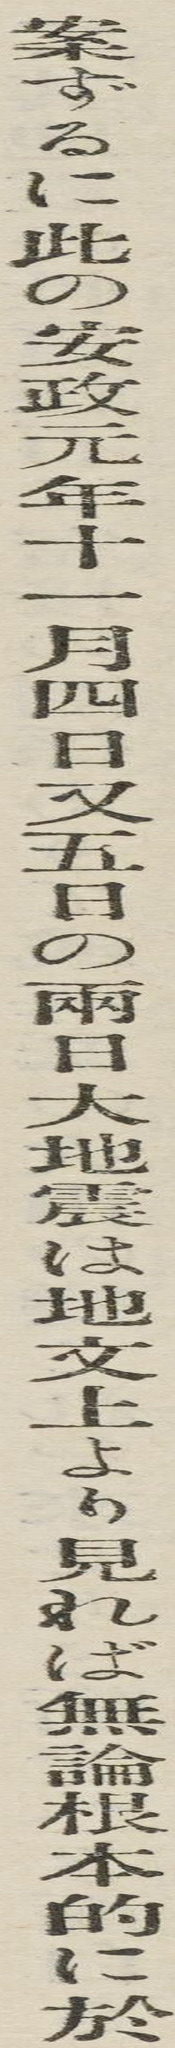案ずるに此の安政元年十一月四日又五日の両日大地震は地文上より見れば無論根本的に於
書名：土佐古今ノ地震
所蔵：東京大学地震研究所図書室 Earthquake Research Institute Library, The University of Tokyo, JAPAN
